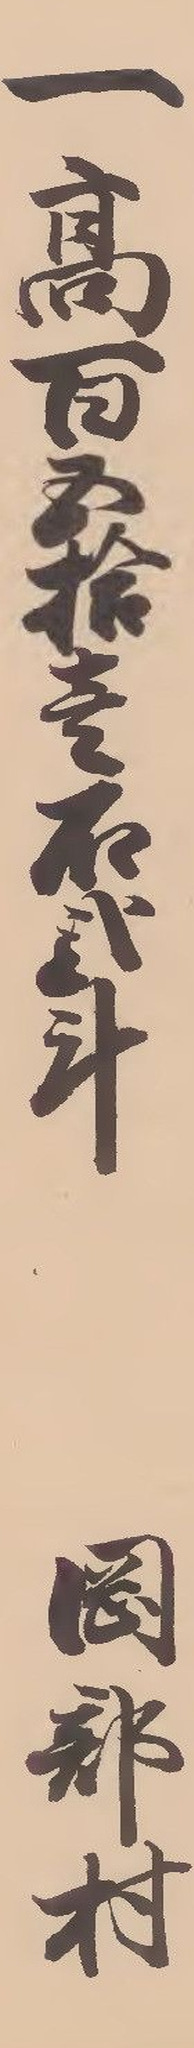一高百五拾壱石弐斗岡部村

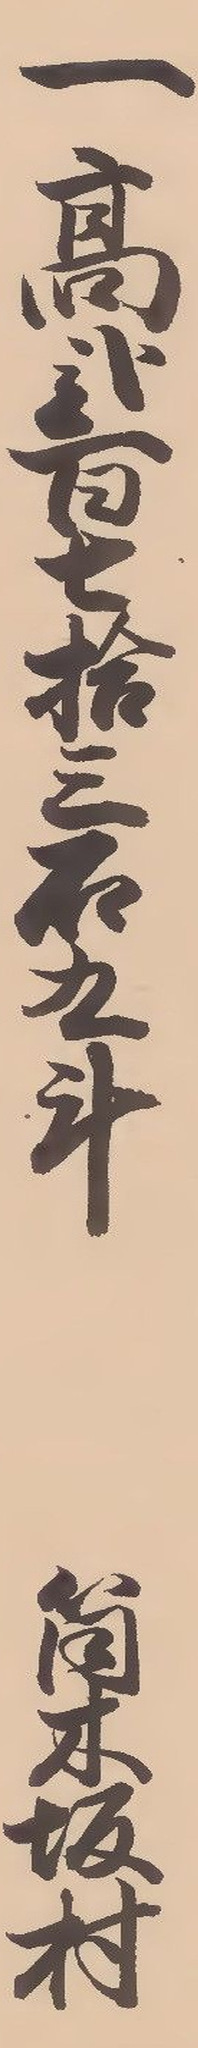一高弐百七拾三石九斗筒木坂村
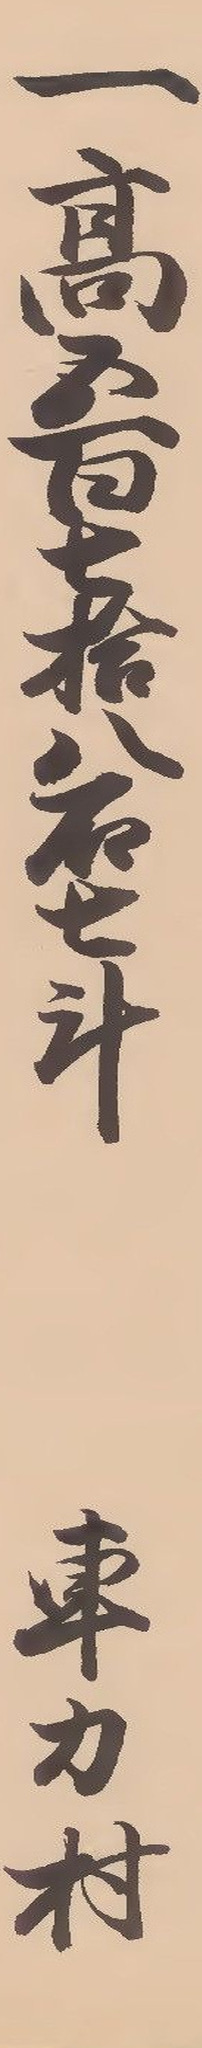一高五百七拾八石七斗車力村
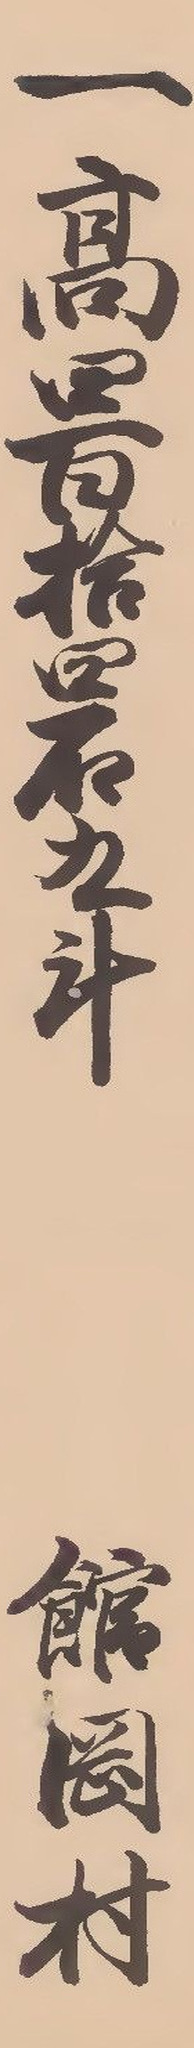一高四百拾四石九斗館岡村
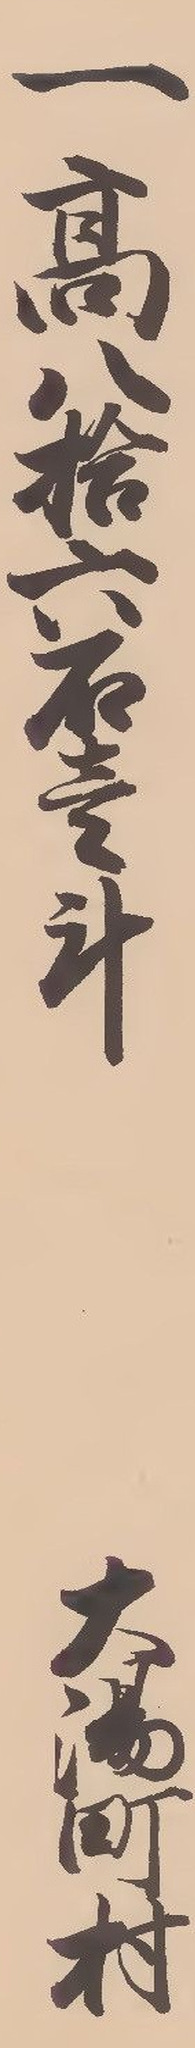一高八拾六石壱斗大湯町村

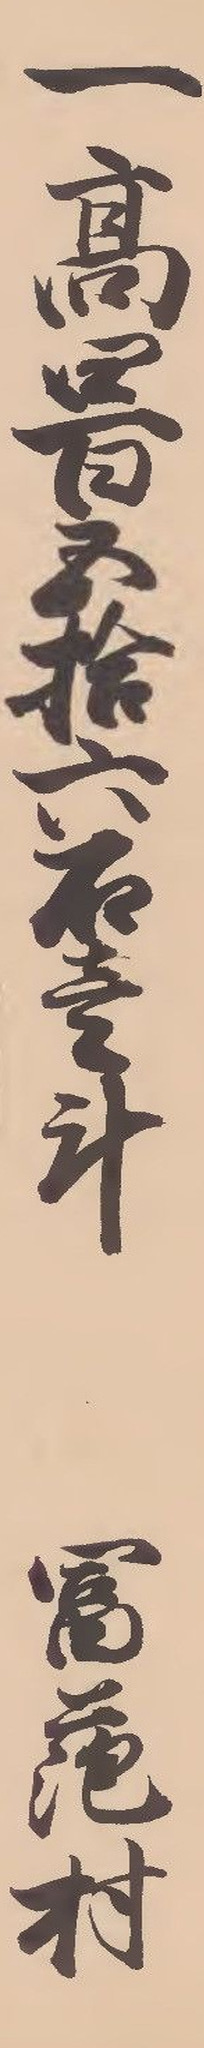一高四百五拾六石壱斗富萢村
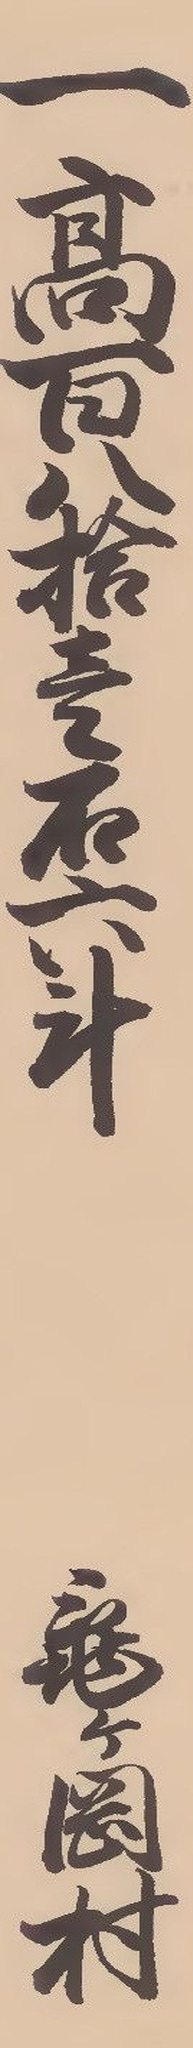一高百八拾壱石六斗亀ヶ岡村
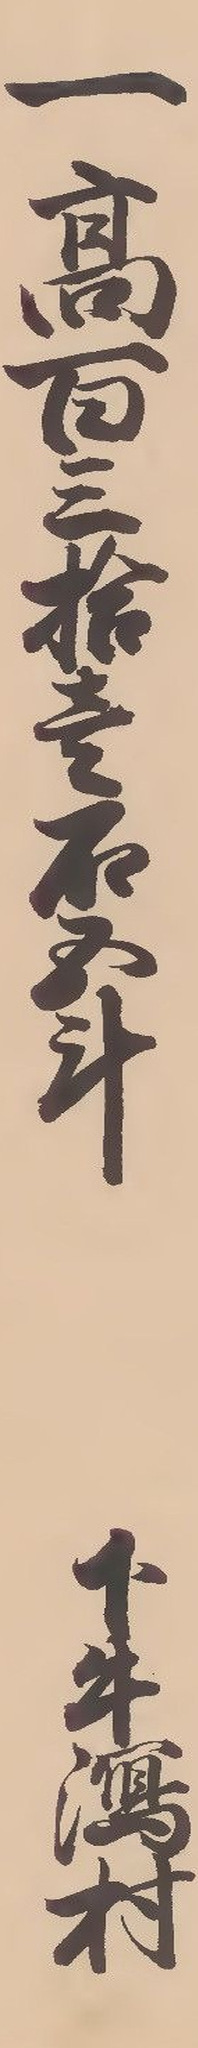一高百三拾壱石五斗下牛潟村

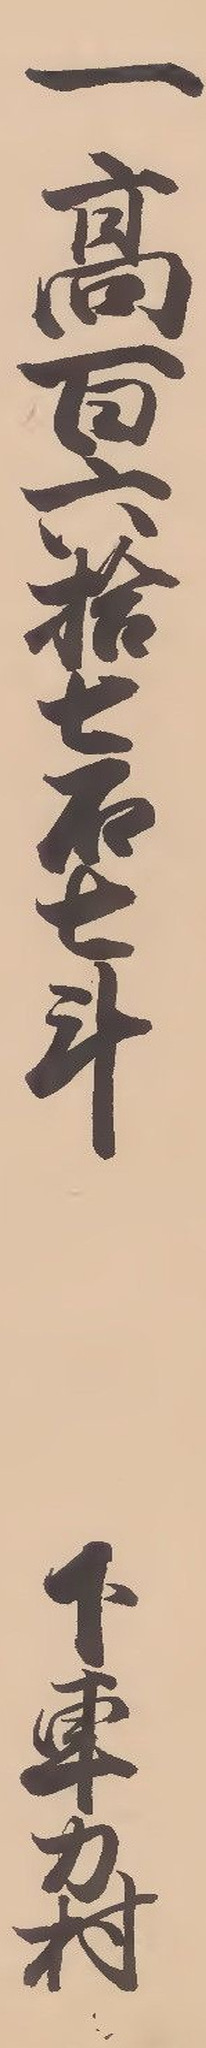一高百六拾七石七斗下車力村
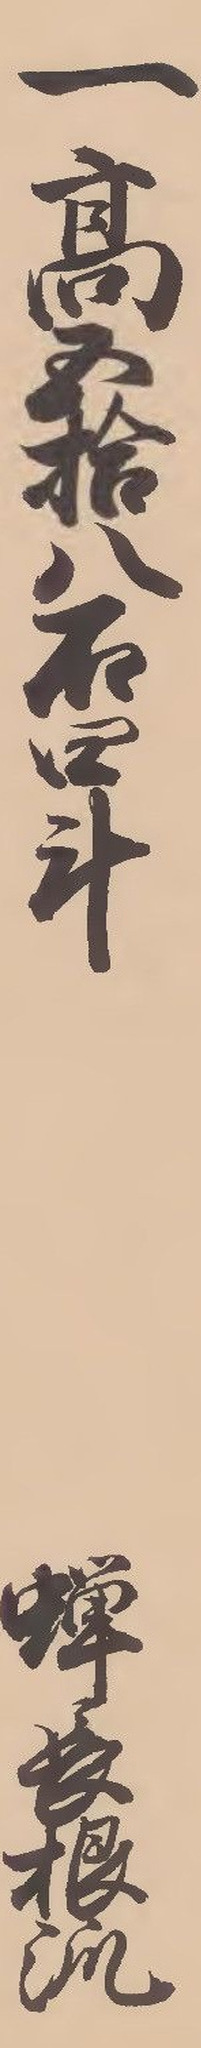一高五拾八石四斗蝉長根派
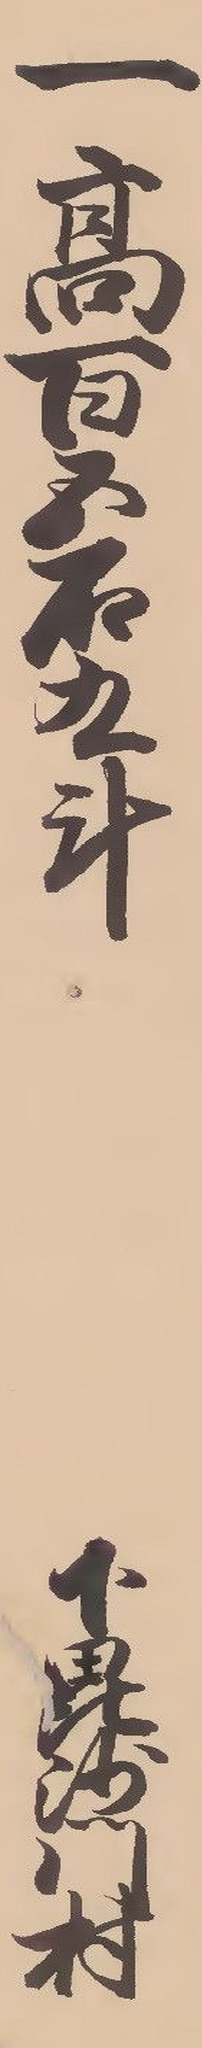一高百五石九斗下毘沙門村
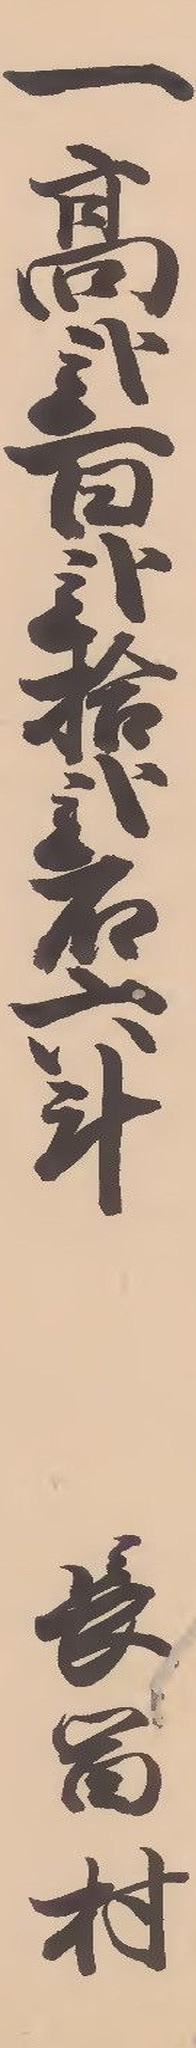一高弐百弐拾弐石六斗長富村
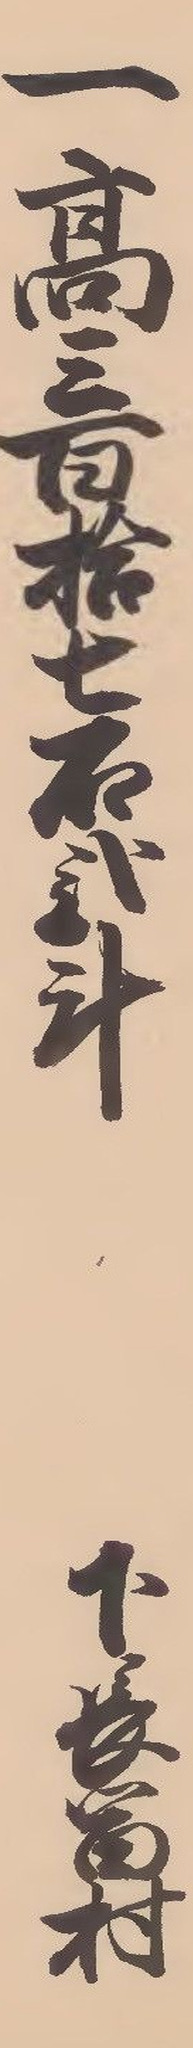一高三百拾七石弐斗下長富村
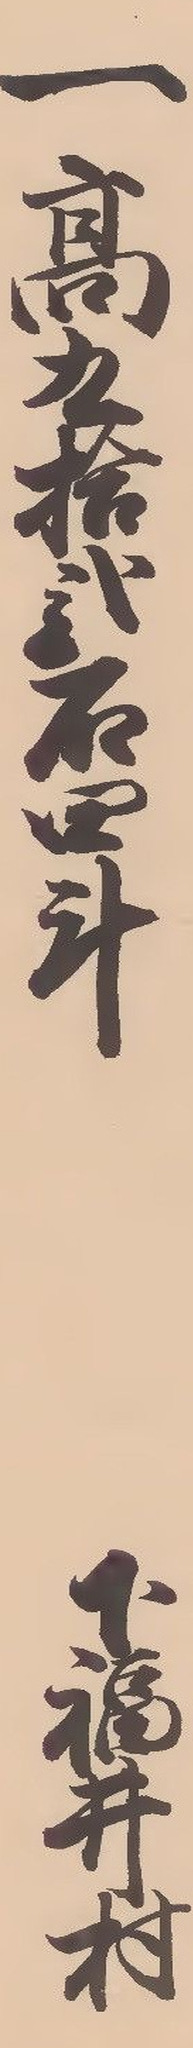一高九拾弐石四斗下福井村

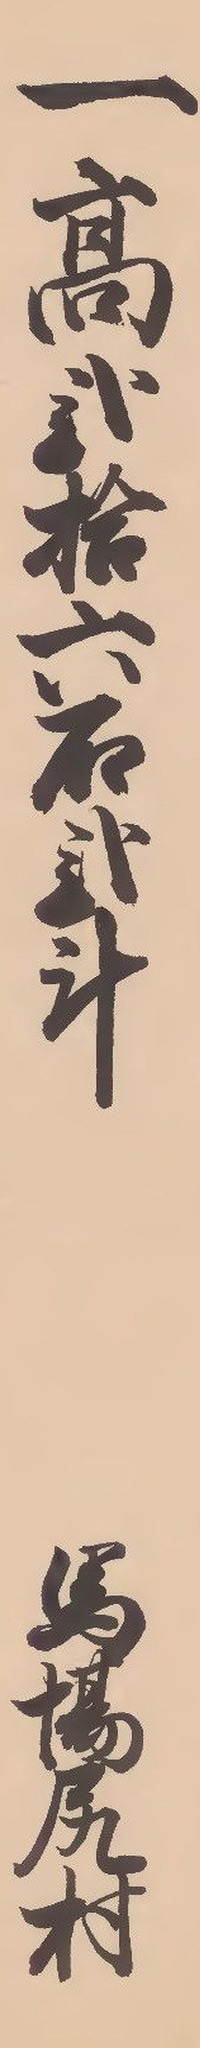一高弐拾六石弐斗馬場尻村

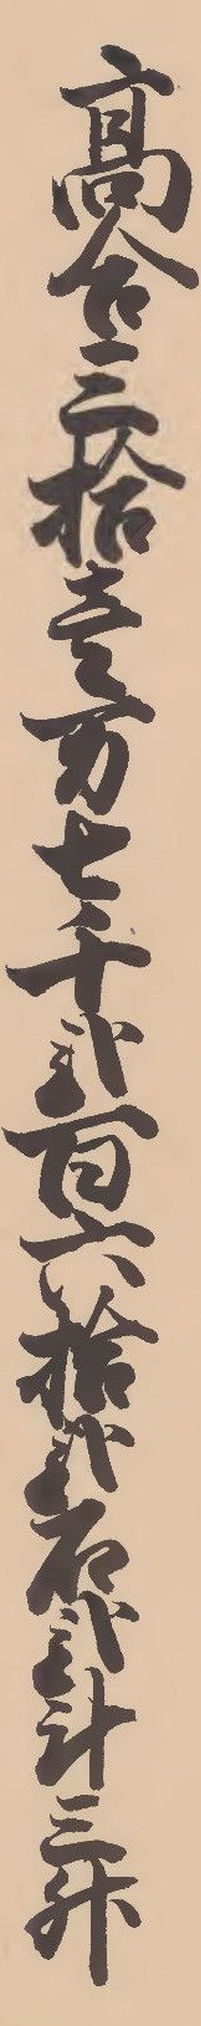高合三拾壱万七千弐百六拾弐石弐斗三升
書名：陸奥国郷帳　７
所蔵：国立公文書館 National Archives of Japan
